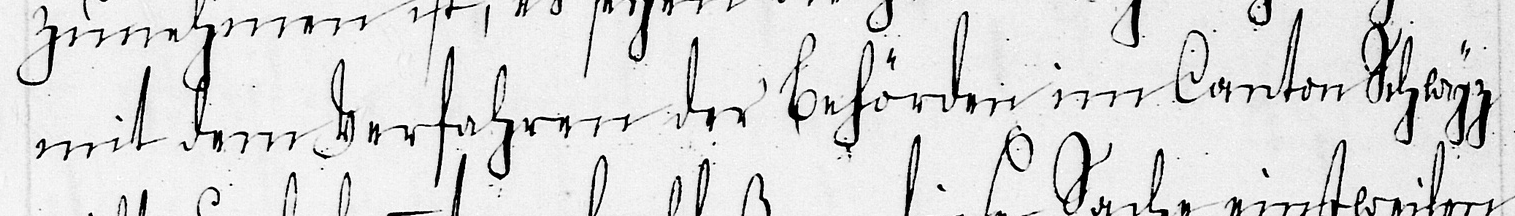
mit dem Verfahren der Behörden im Canton Schwyz
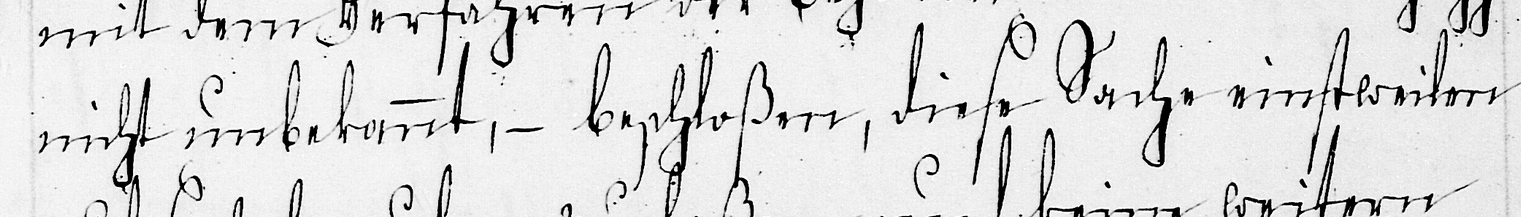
nicht unbekannt, – beschloßen, diese Sache einstweilen
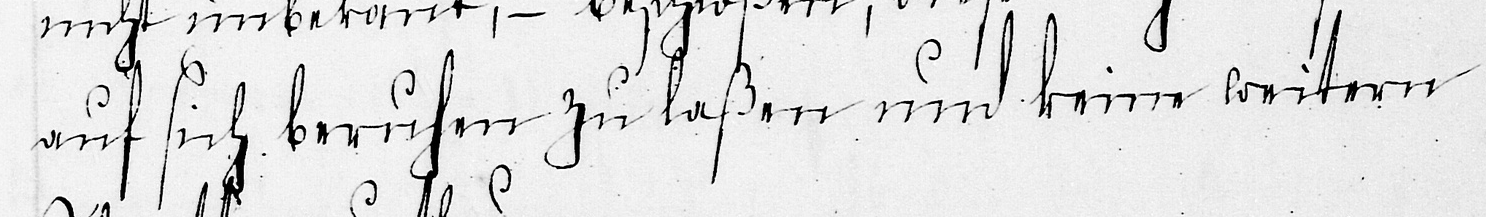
auf sich beruhen zu laßen und keine weitern
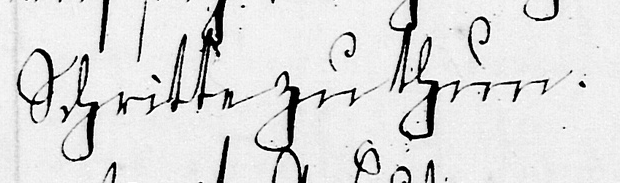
Schritte zu thun.
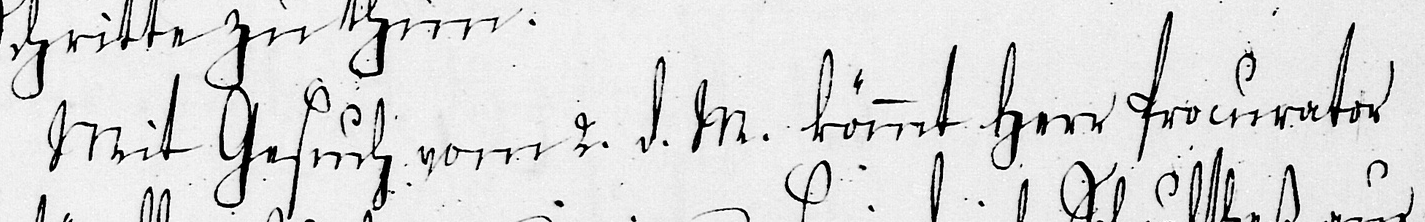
Mit Gesuch vom 2. d. M. kömmt Herr Procurator
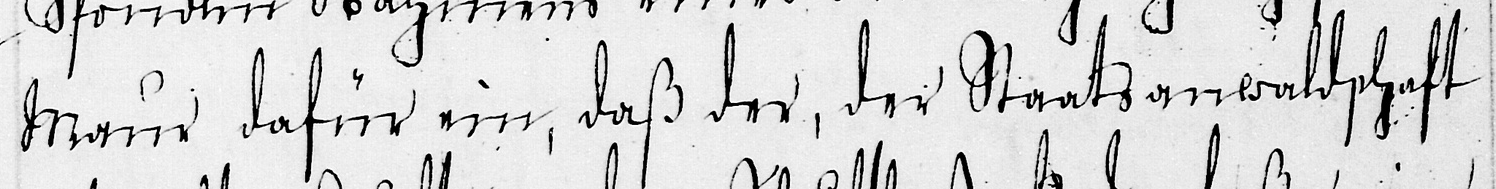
Maur dafür ein, daß der, der Staatsanwaldschaft
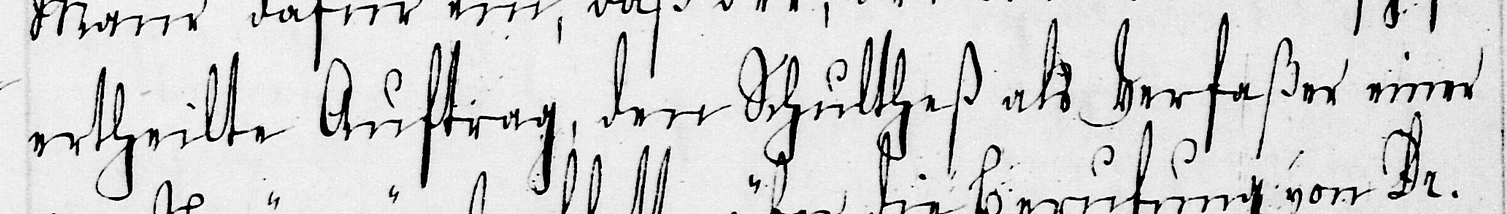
ertheilte Auftrag, den Schultheß als Verfaßer einer
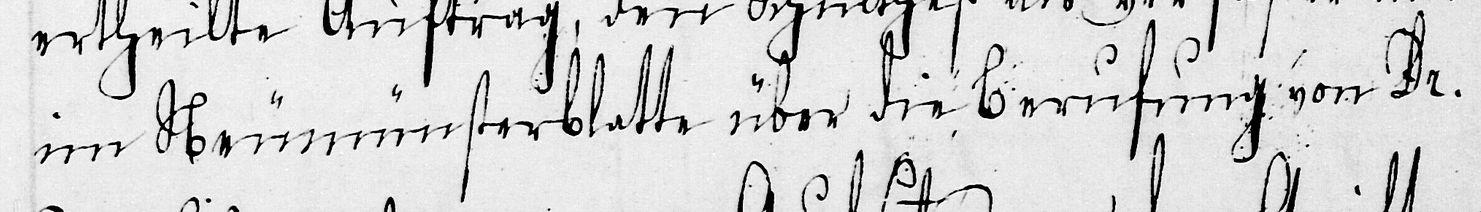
im Neumünsterblatte über die Berufung von Dr.
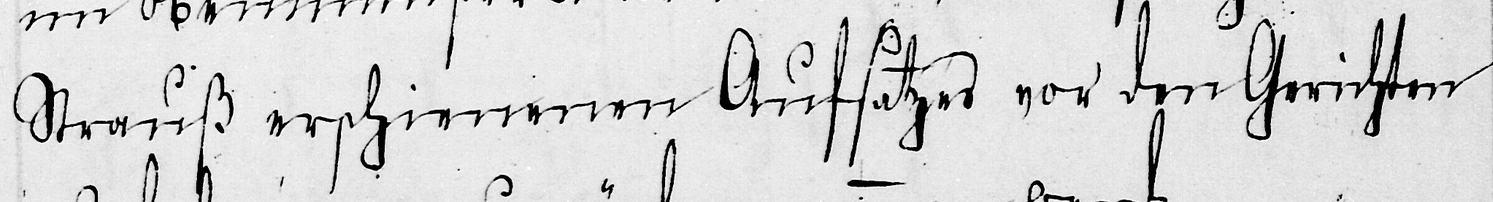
Strauß erschienenen Aufsatzes vor den Gerichten
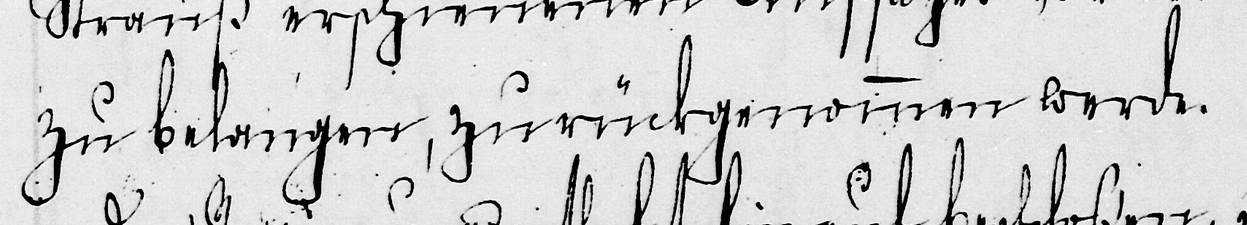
zu belangen, zurückgenommen werde.
